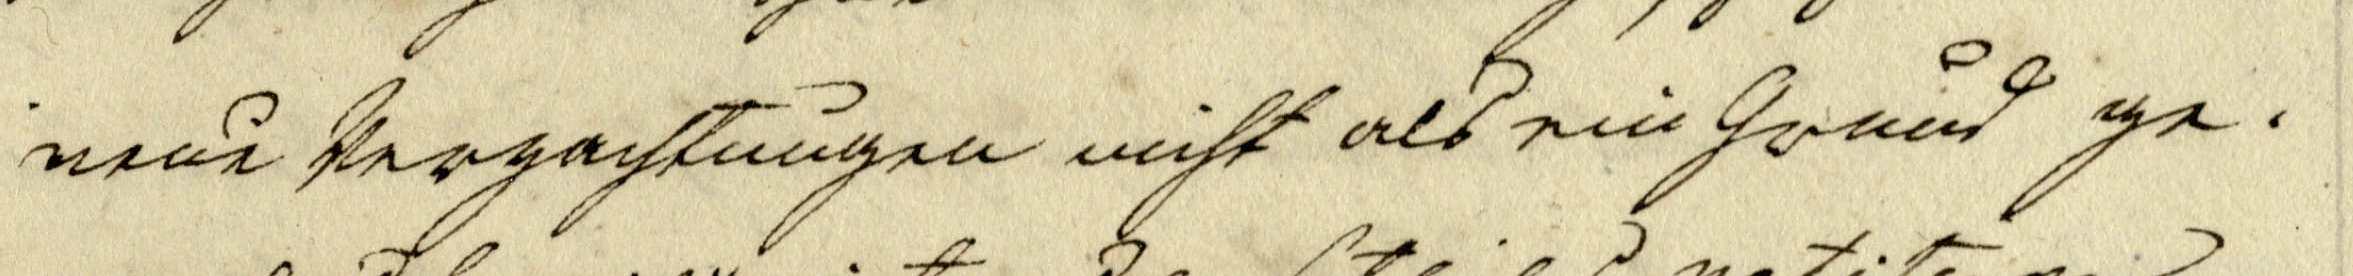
neue Verpachtungen nicht als ein Grund ge¬
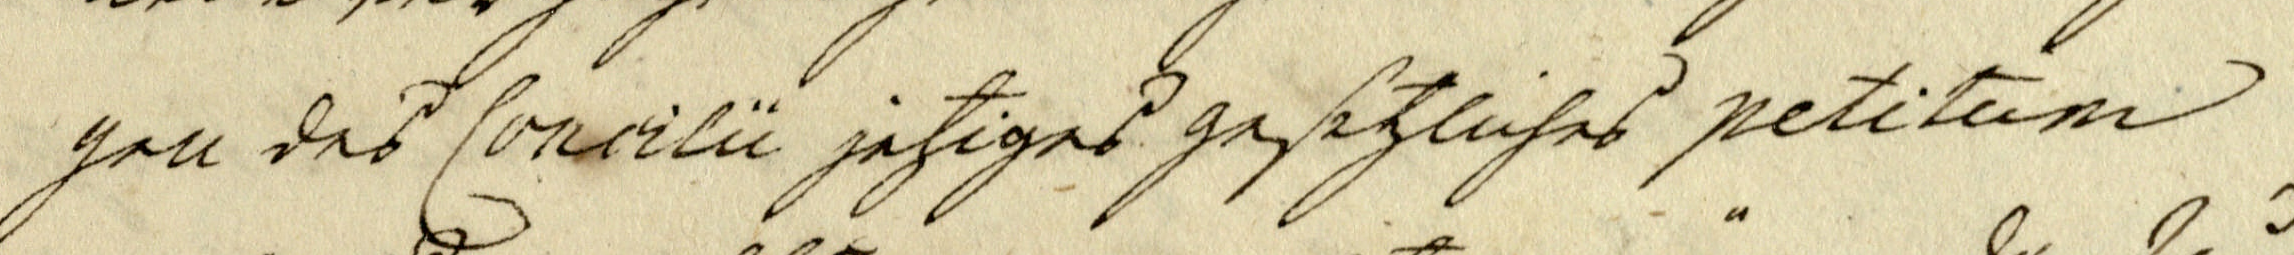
gen des Concilii jetziges gesetzliches petitum
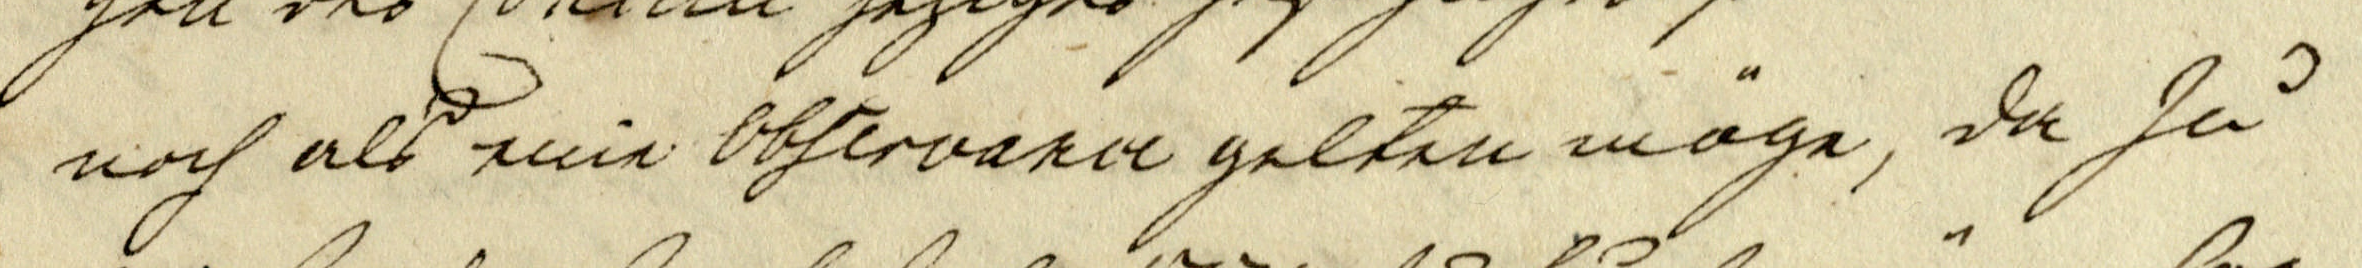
noch als eine Observance gelten möge, da zu
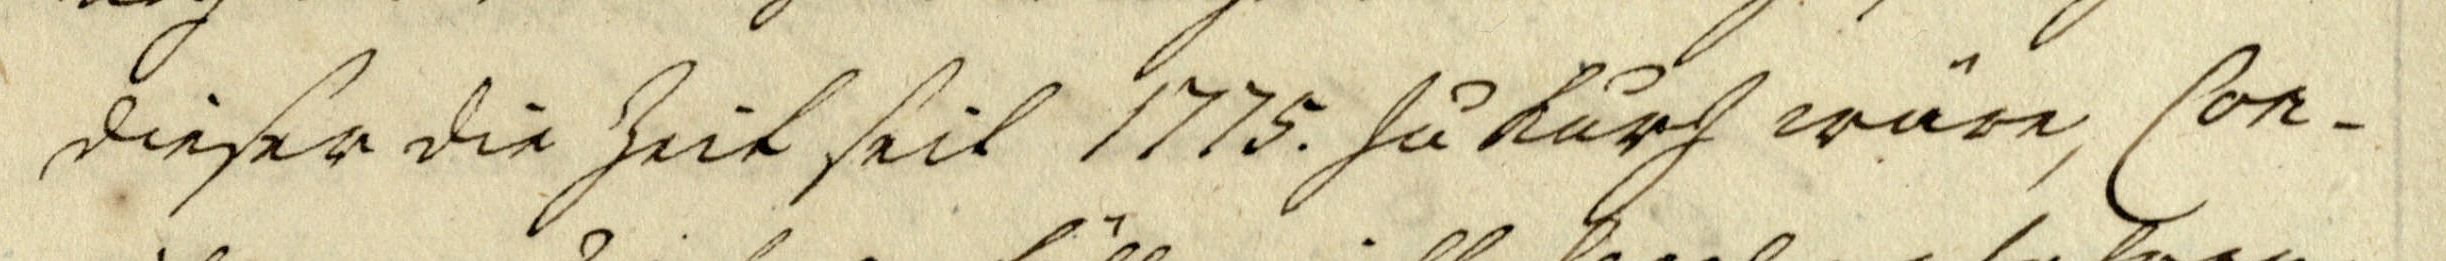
dieser die Zeit seit 1775. zu kurz wäre, Con¬
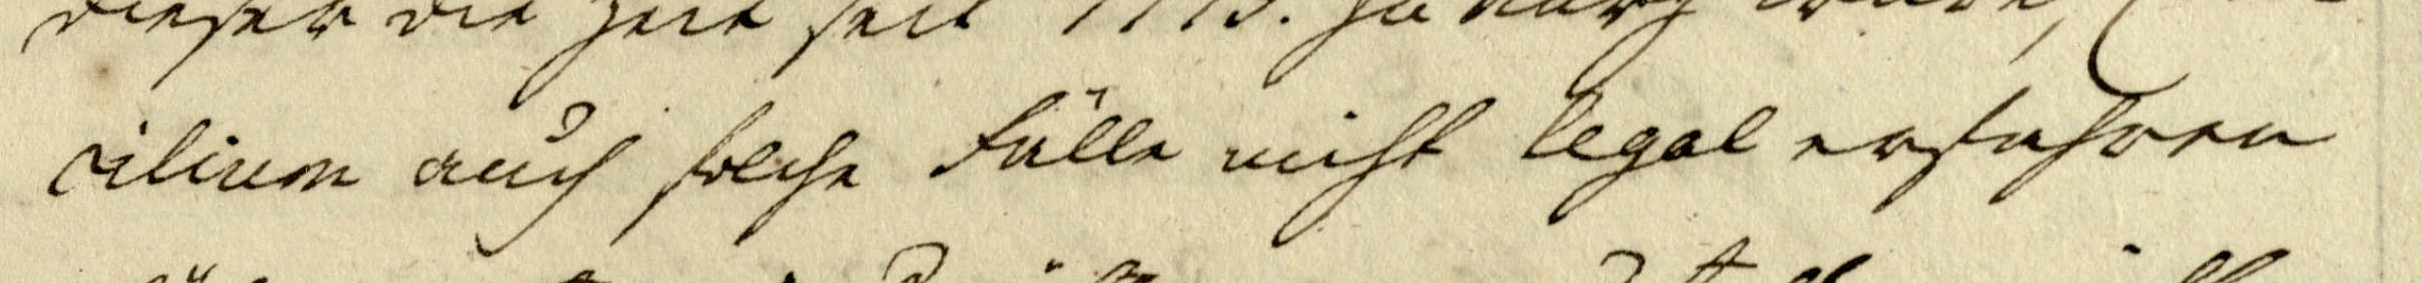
cilium auch solche Fälle nicht legal erfahren
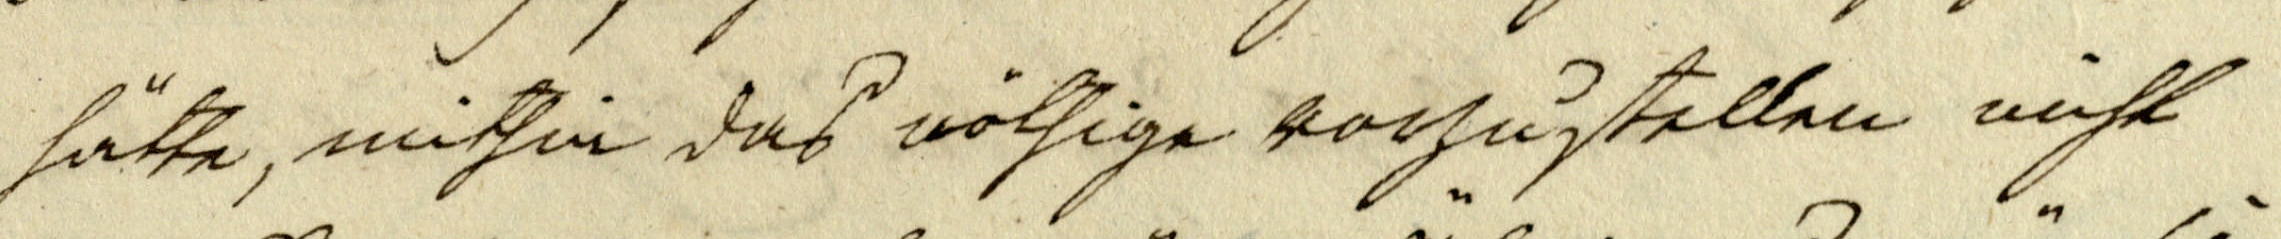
hätte, mithin das nöthige vorzustellen nicht
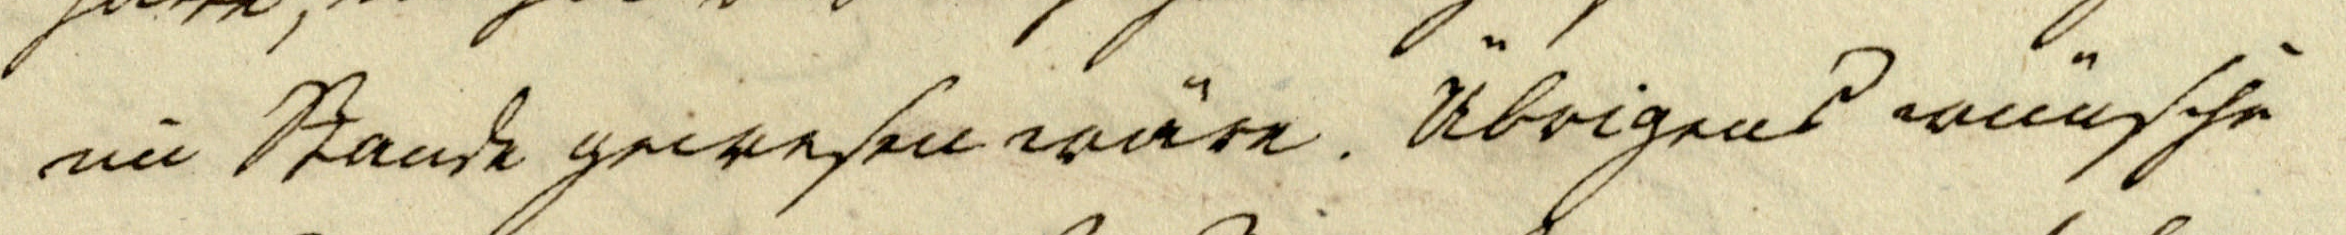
im Stande gewesen wäre. Übrigens wünsche
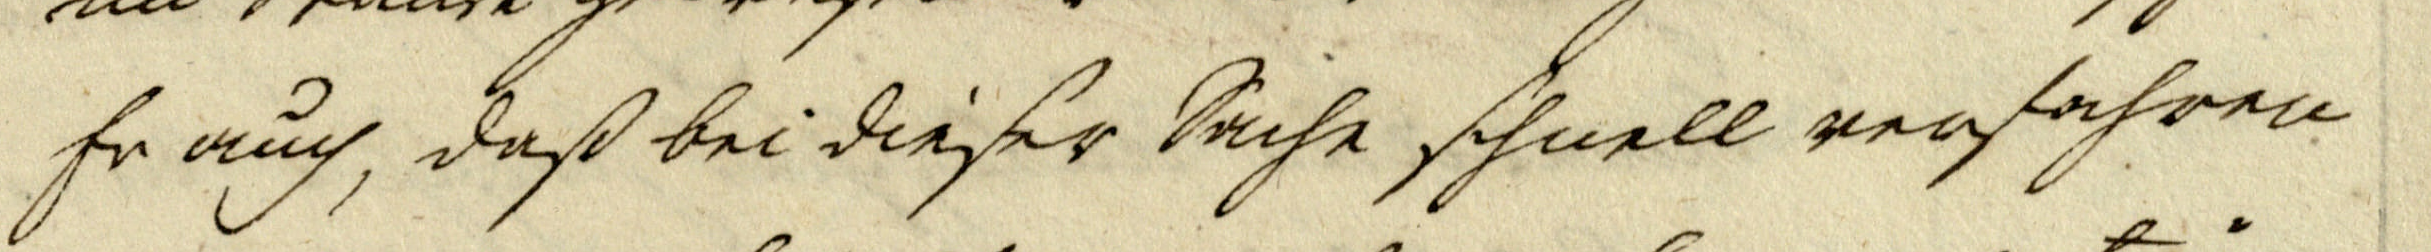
Er auch, daß bei dieser Sache schnell verfahren
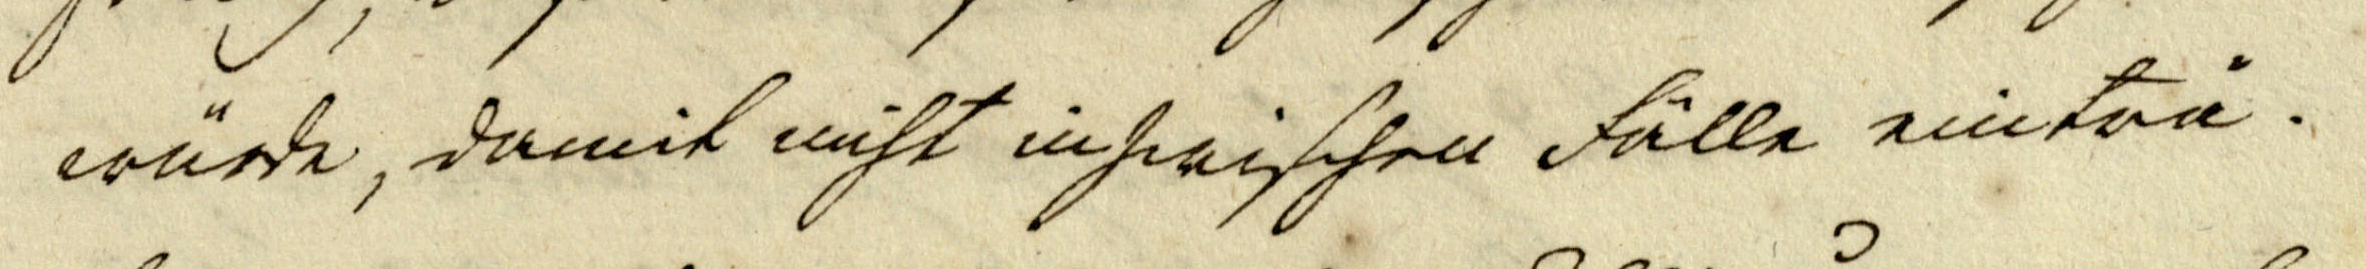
würde, damit nicht inzwischen Fälle einträ¬
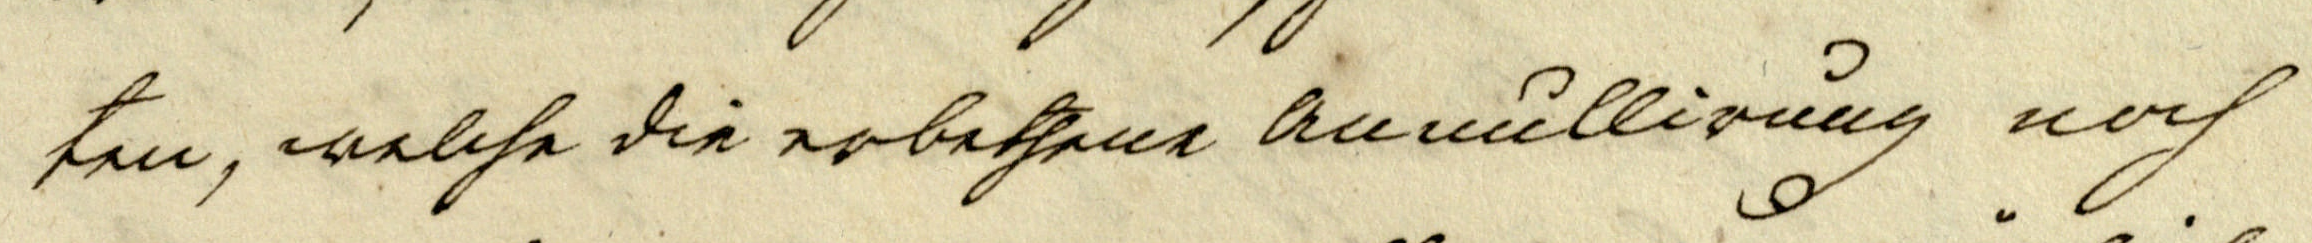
ten, welche die erbethene Annullirung noch
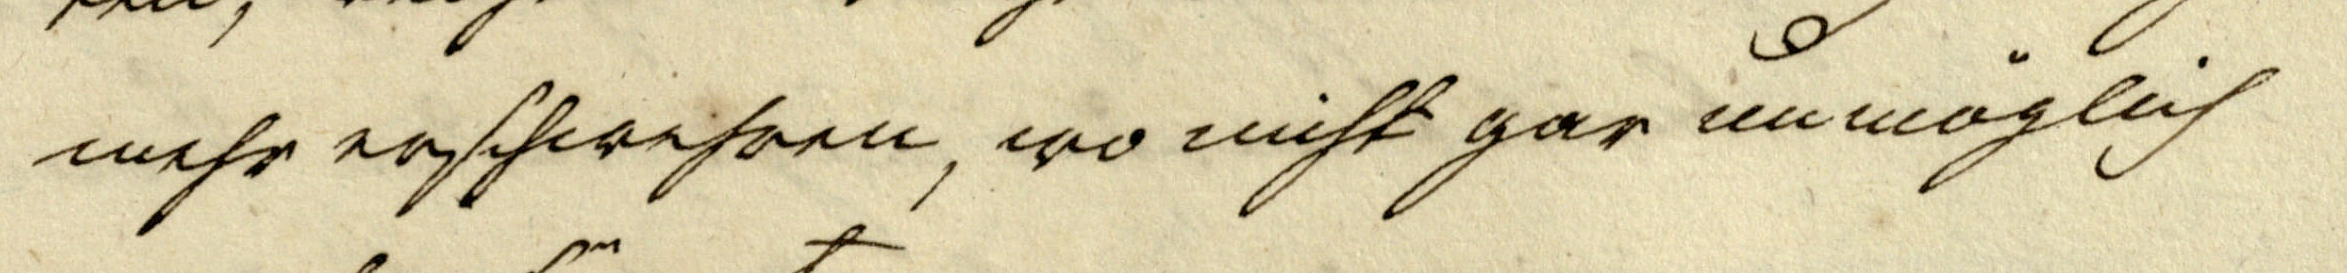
mehr erschwehren, wo nicht gar unmöglich
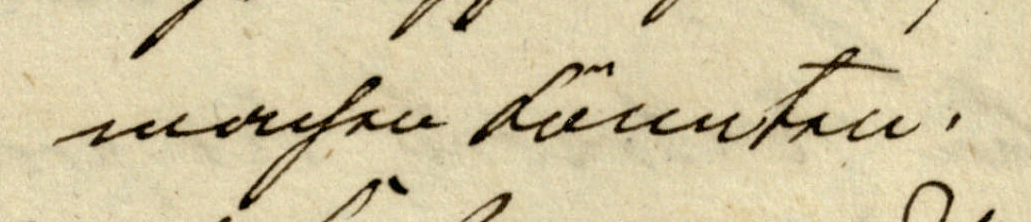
machen könnten.
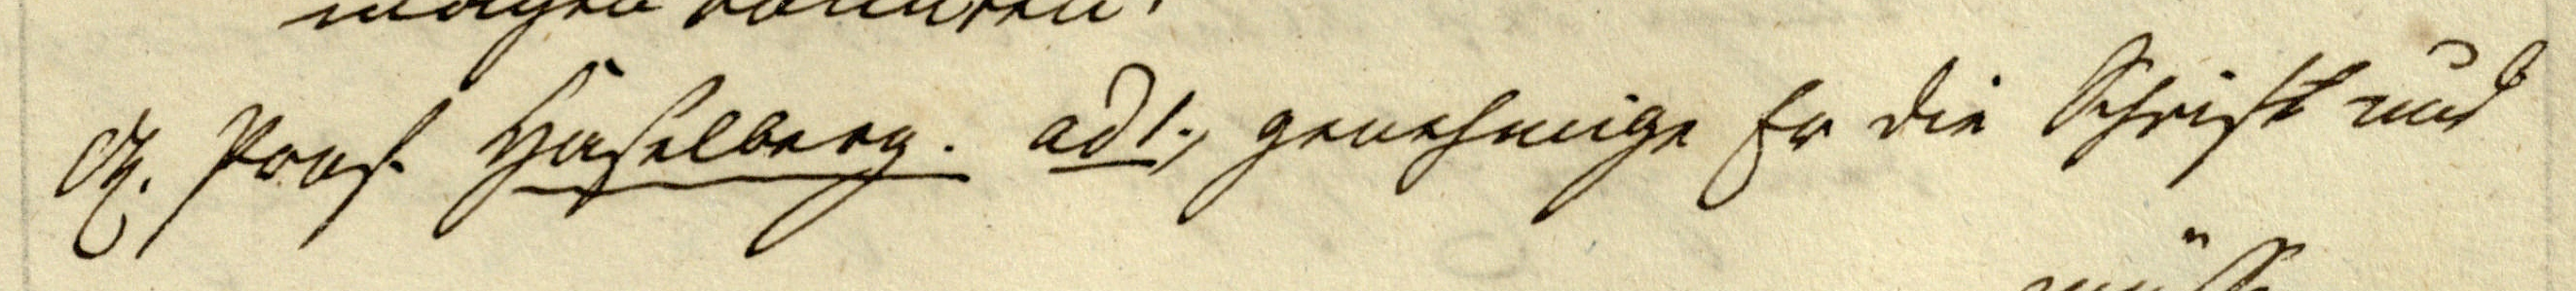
dh. Prof. Haselberg. ad1., genehmiget Er die Schrift und
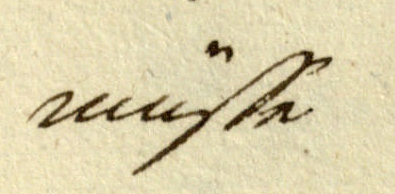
müsse
